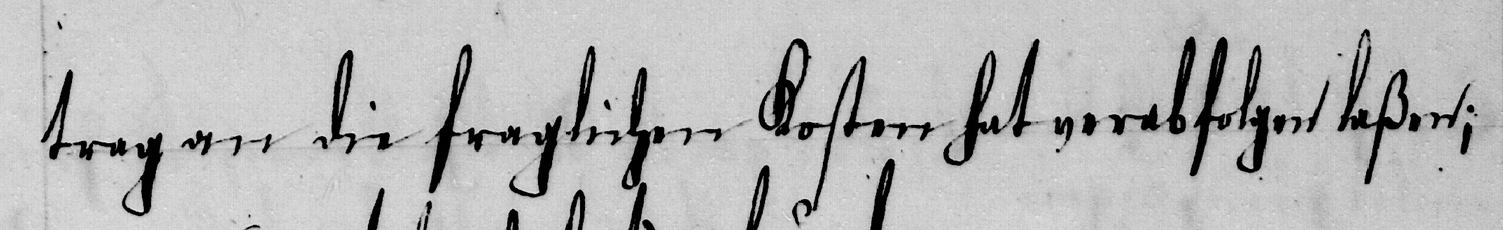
trag an die fraglichen Kosten hat verabfolgen laßen;
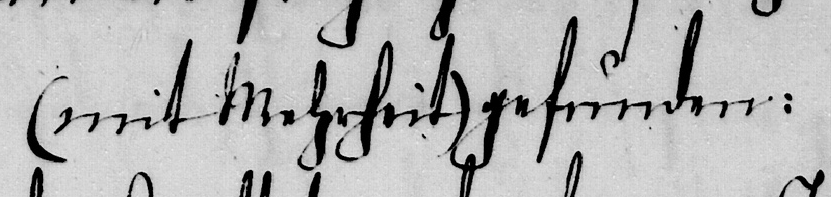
(mit Mehrheit) gefunden:
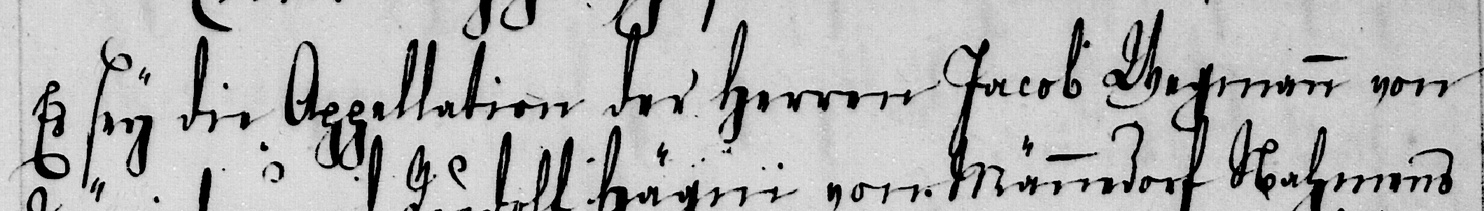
Es sey die Appellation der Herren Jacob Wegmann von
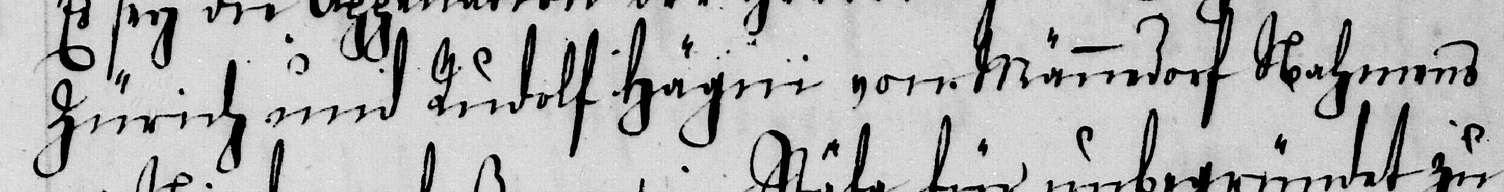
Zürich und Rudolf Hägni von Männedorf Nahmens
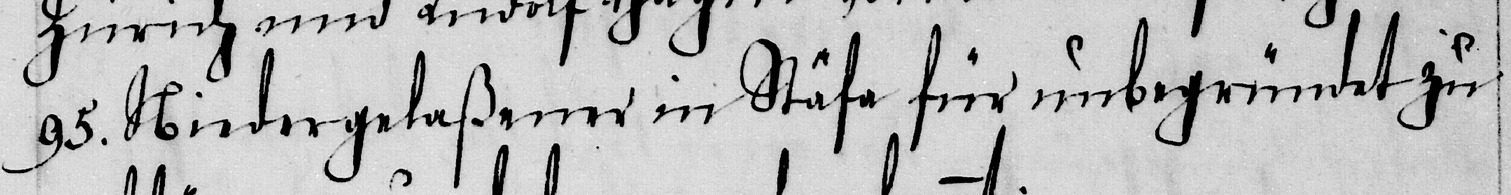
95. Niedergelaßenen in Stäfa für unbegründet zu
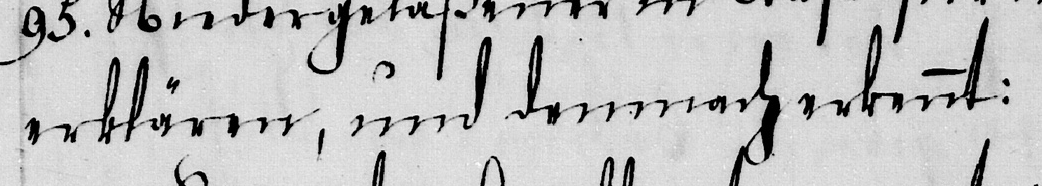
erklären, und demnach erkennt:
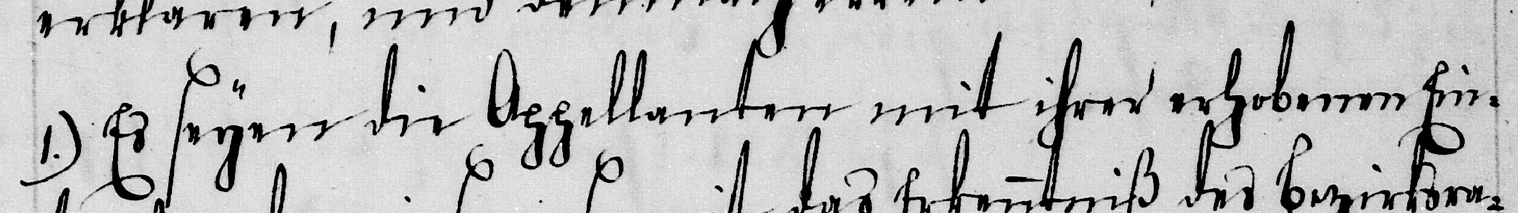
1.) Es seyen die Appellanten mit ihrer erhobenen Ein¬
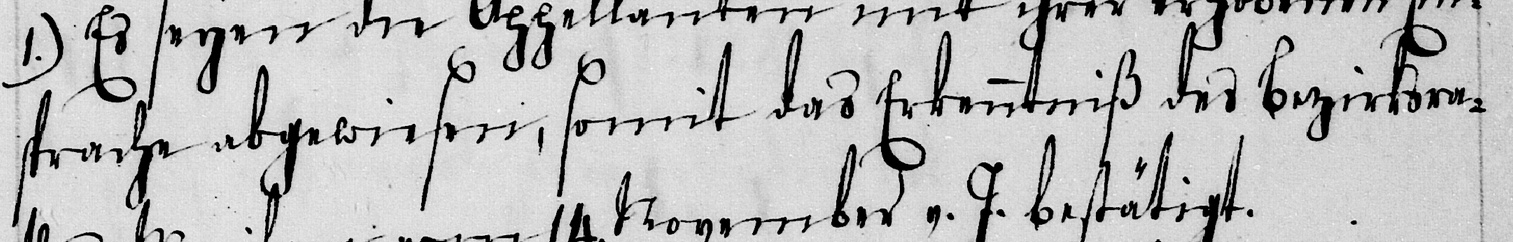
sprache abgewiesen, somit das Erkenntniß des Bezirksra¬
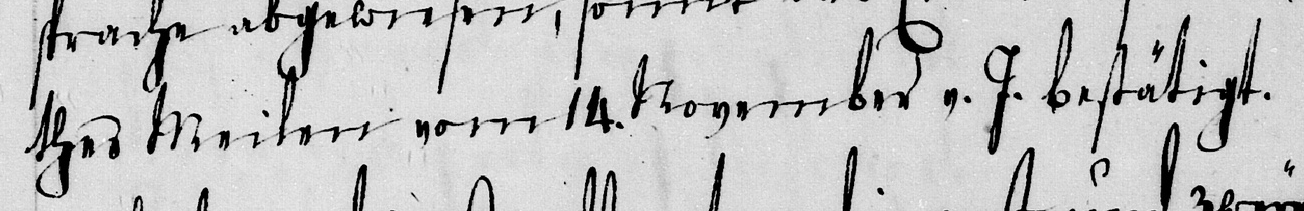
thes Meilen vom 14. November v. J. bestätigt.
